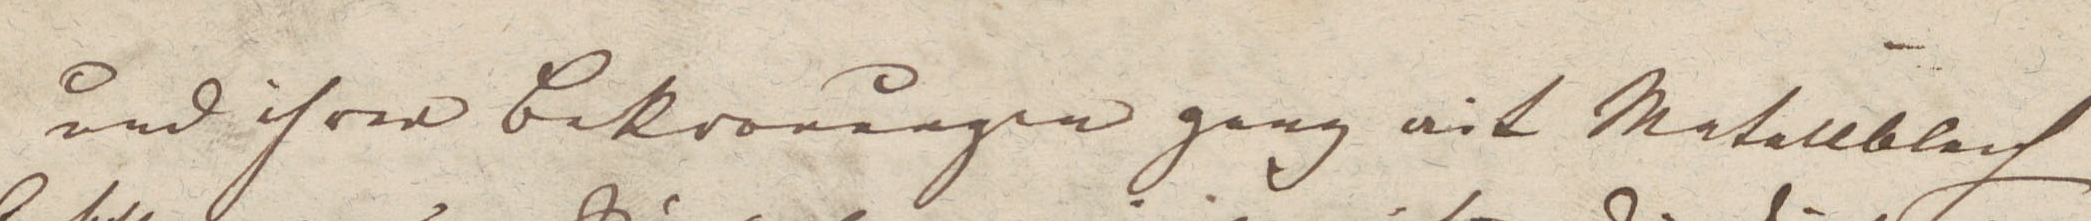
und ihrer Bekronungen ganz mit Metallblech
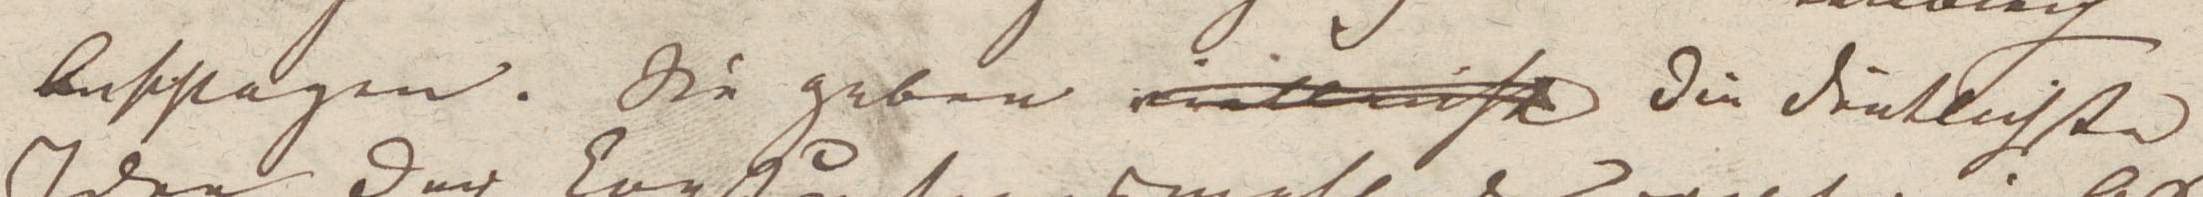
beschlagen. Sie geben vielleicht die deutlichste
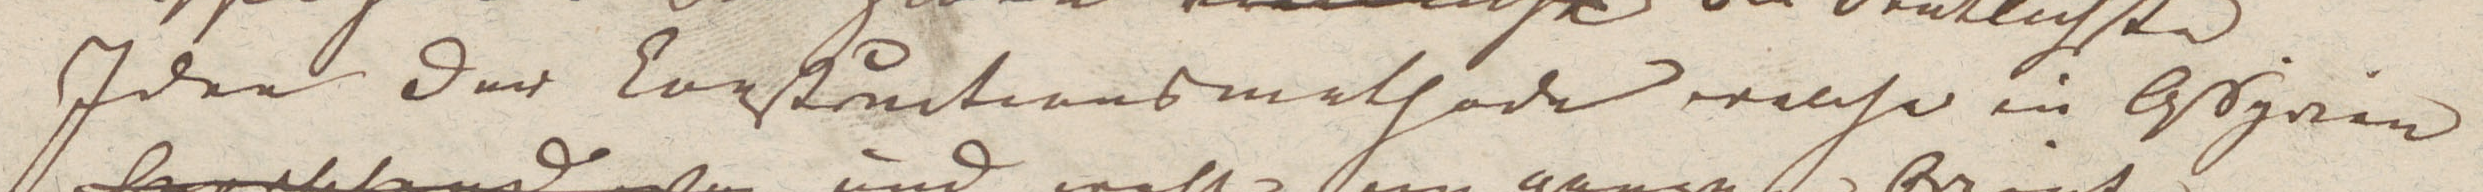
Idee der Constructionsmethode welche in Assyrien
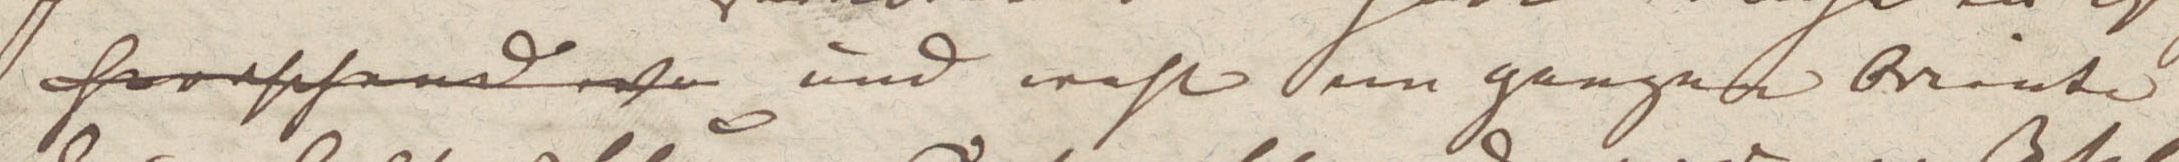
herrschend wo und wohl im ganzen Oriente
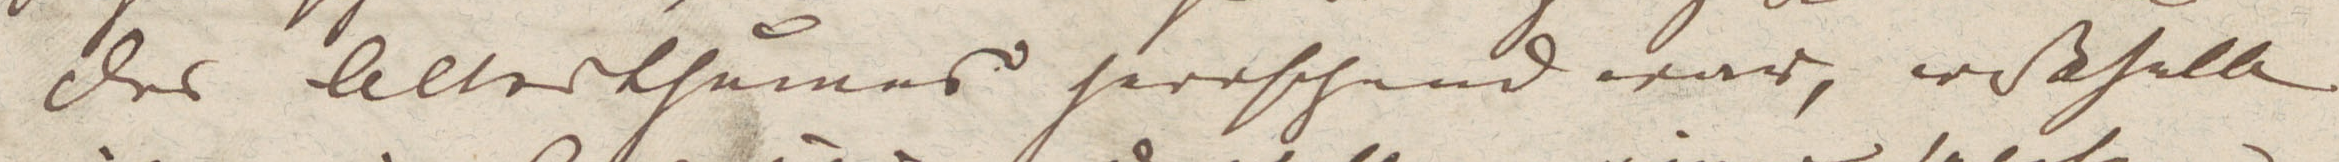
des ALterthumes herrschend war, wesshalb
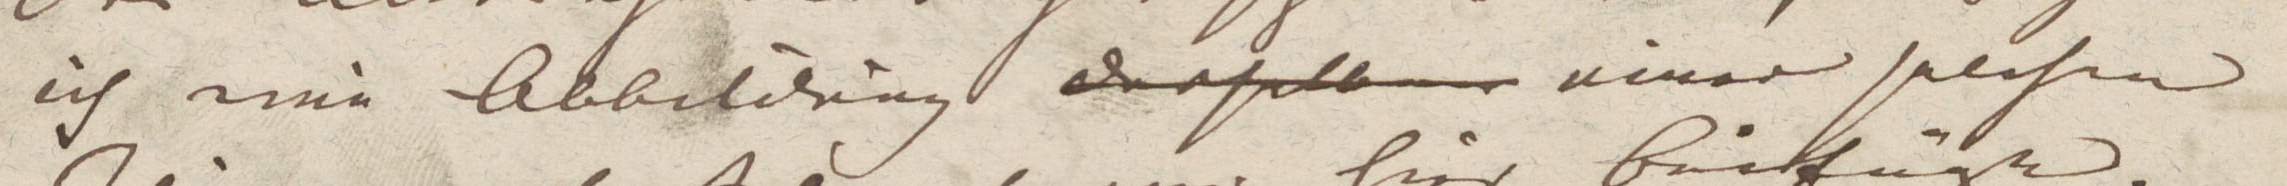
ich eine Abbildung derselben einer solchen
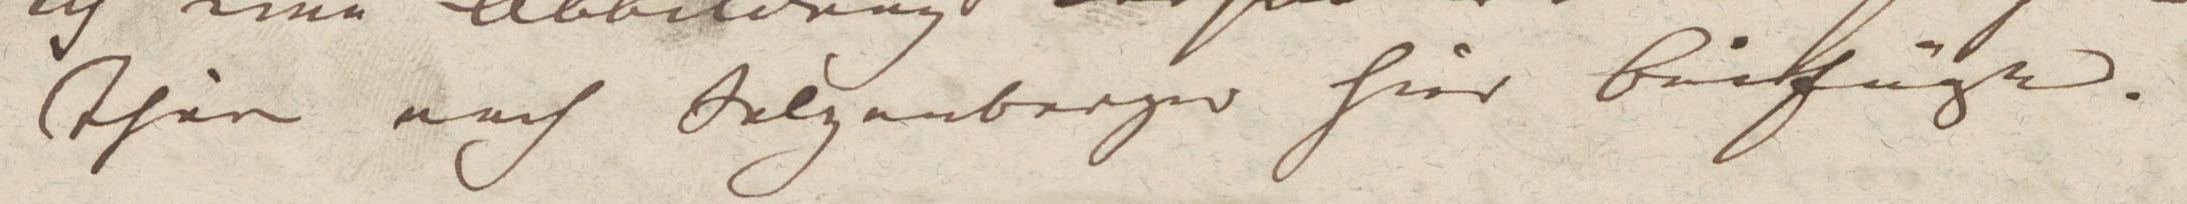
Thür nach Salzenberger hier beifüge.
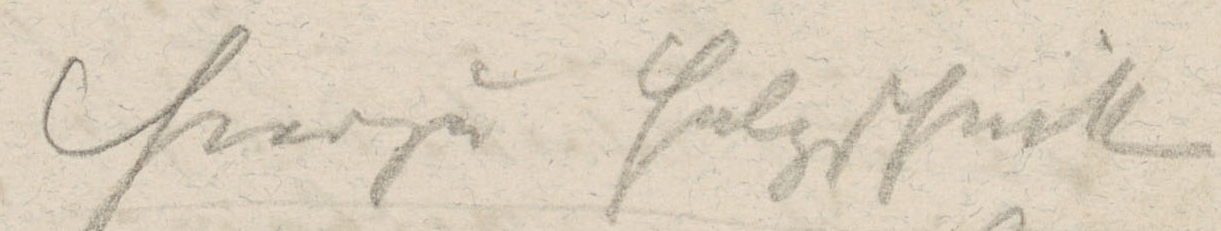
Hierzu Holzschnitt
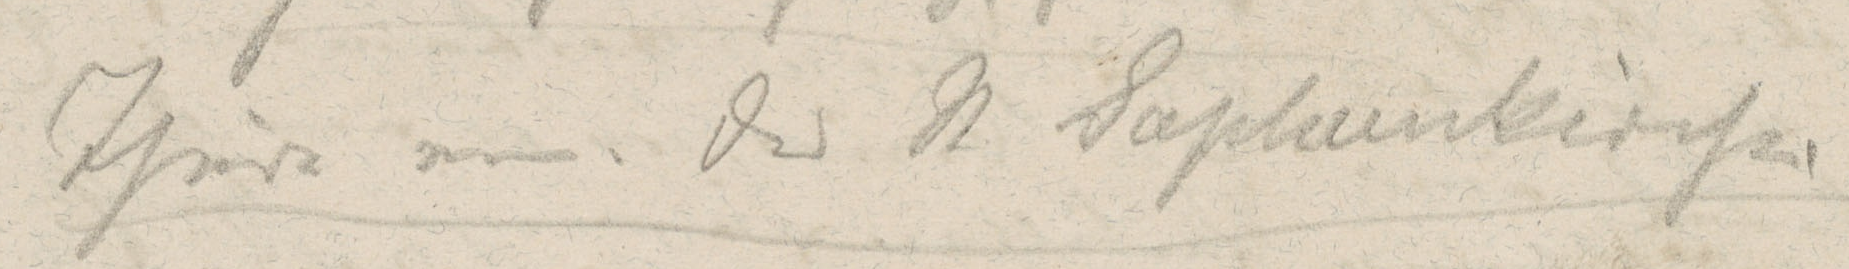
Thüre von der St. Sophienkirche ?
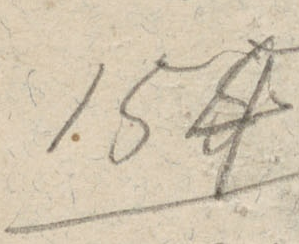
155.
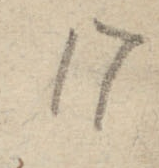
17
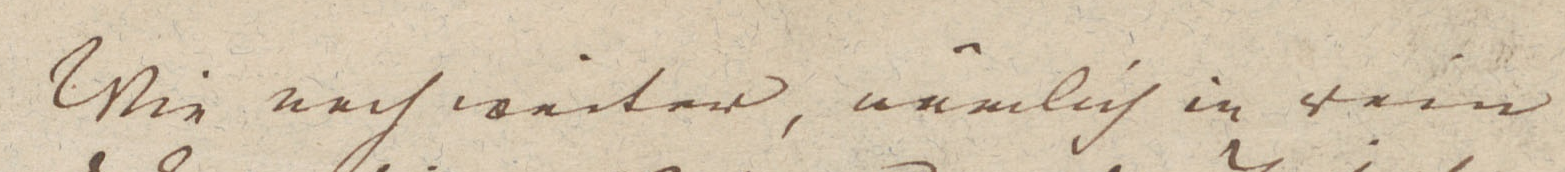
Wie noch weiter, nämlich in rein
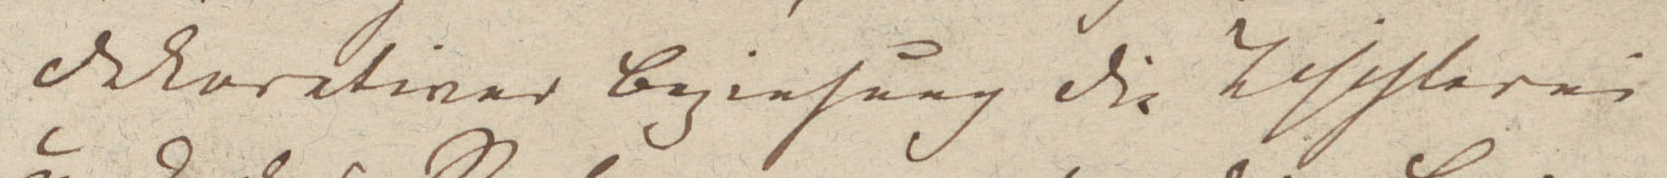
dekorativer Beziehung die Tischlerei
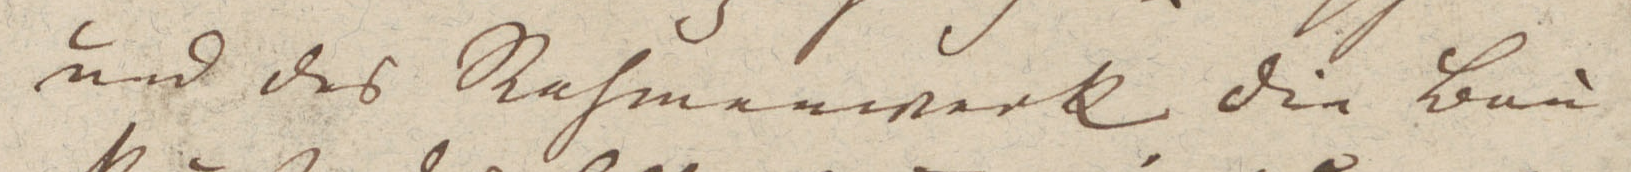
und das Rahmenwerk die Bau-
